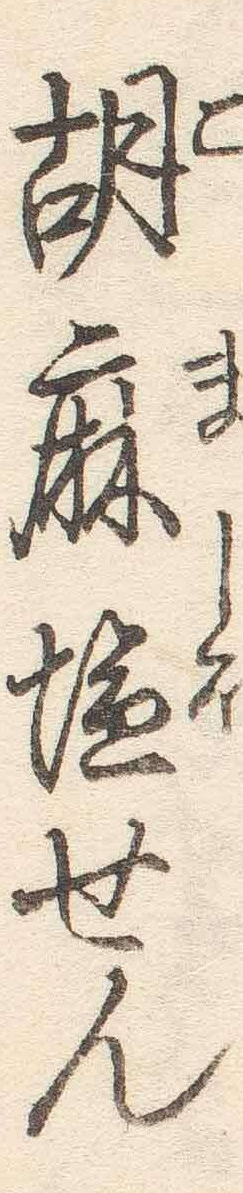胡麻塩せん
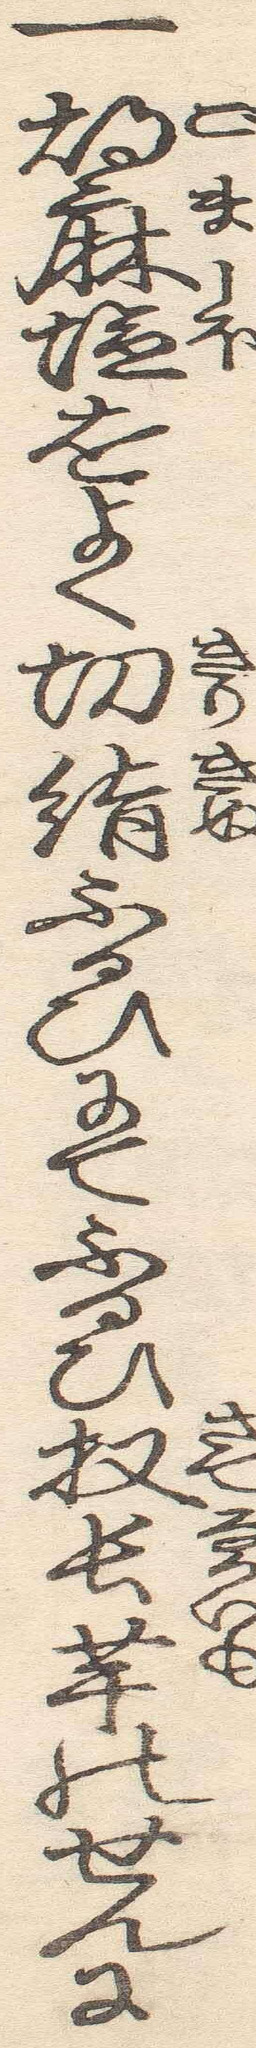一胡麻塩をよく切絹ふるひにてふるひ扨長芋のせんに
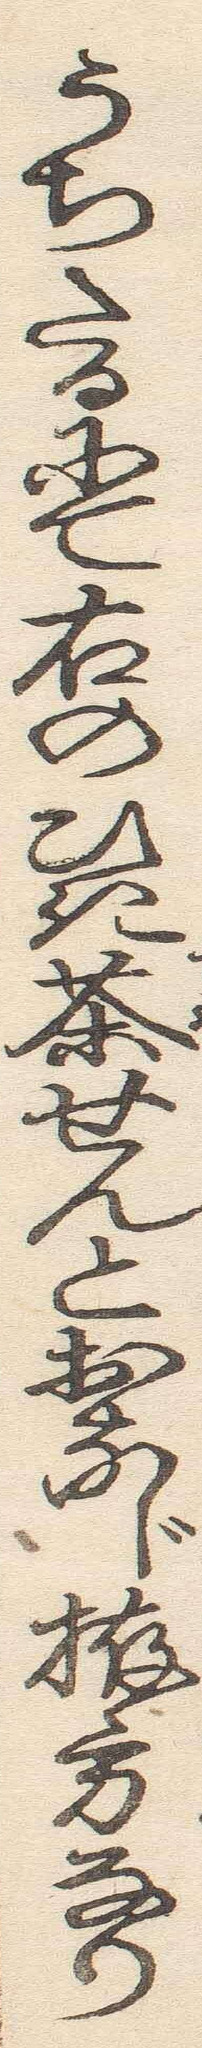うちたるにて右のひき茶せんとおなじ拵方なり
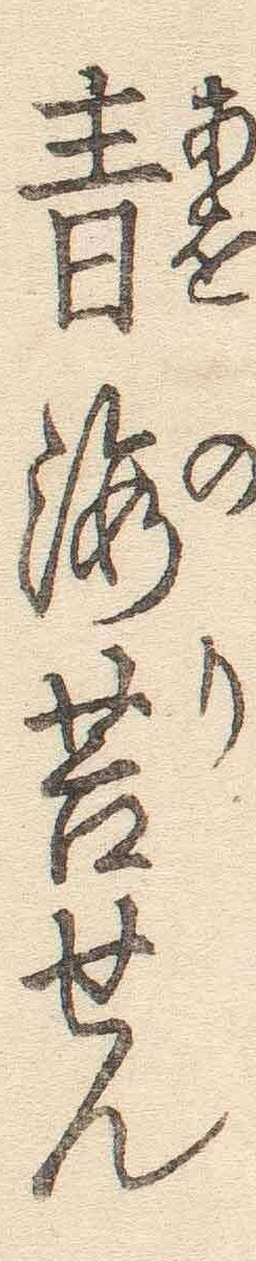青海苔せん
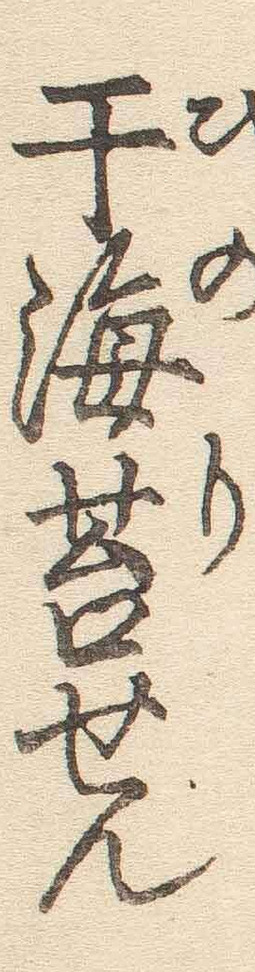干海苔せん
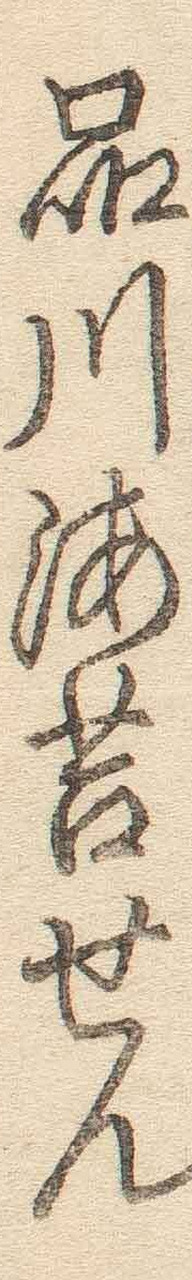品川海苔せん

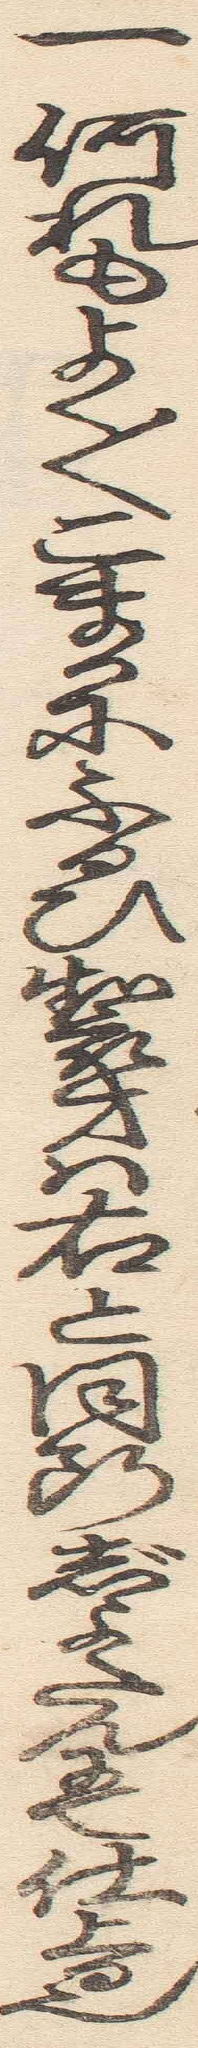一何れもよく〳〵こまかにふるひ製方は右と同断じよたんにて仕上る也
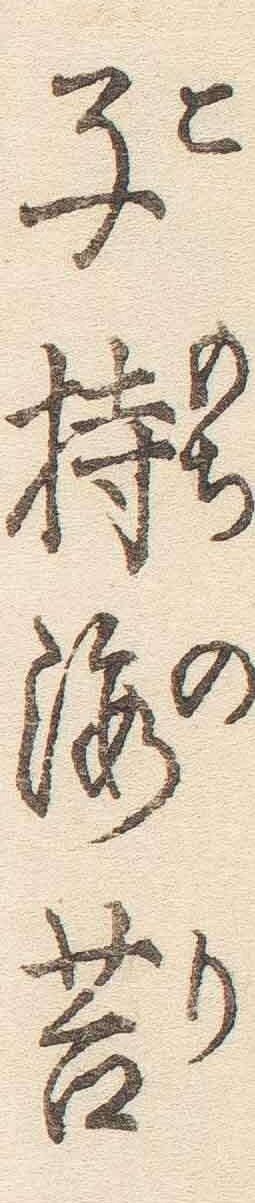子持海苔
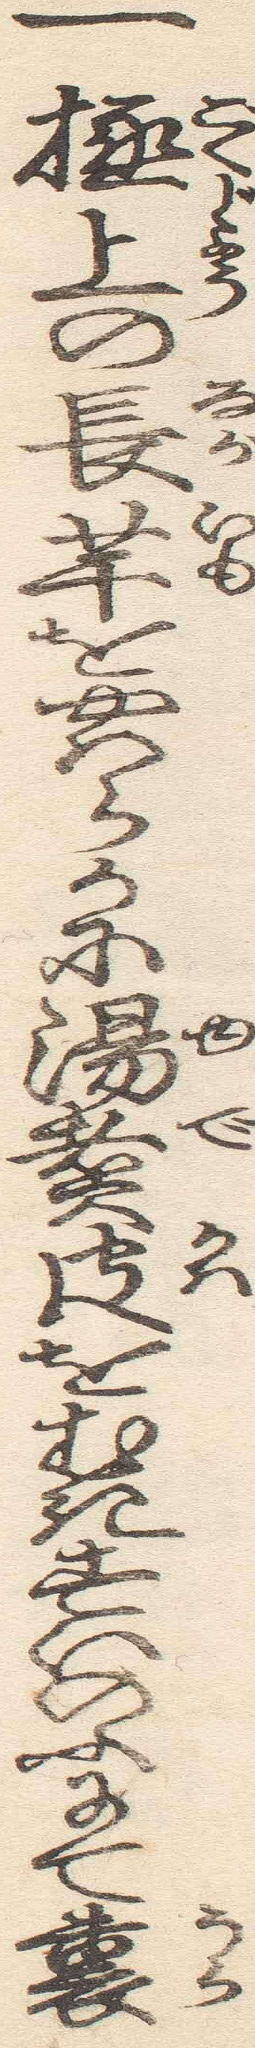一極上の長芋をやはらかに湯煮皮をむきすいのふにて裏
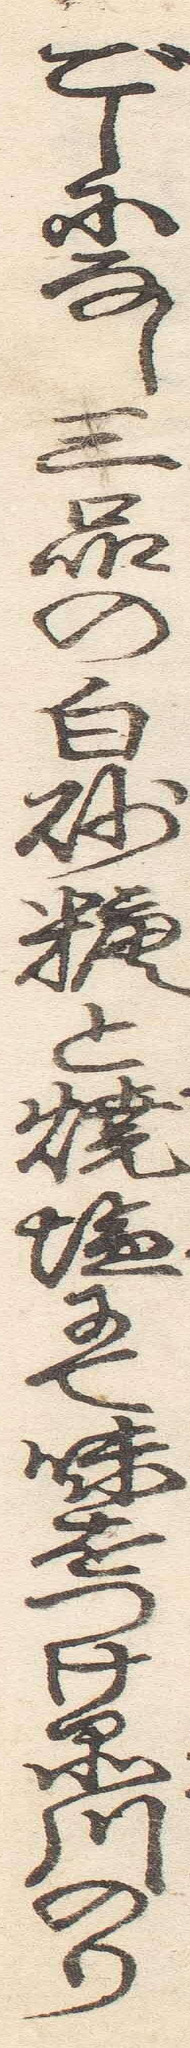ごしになし三品の白砂糖と焼塩にて味をつけ品川のり
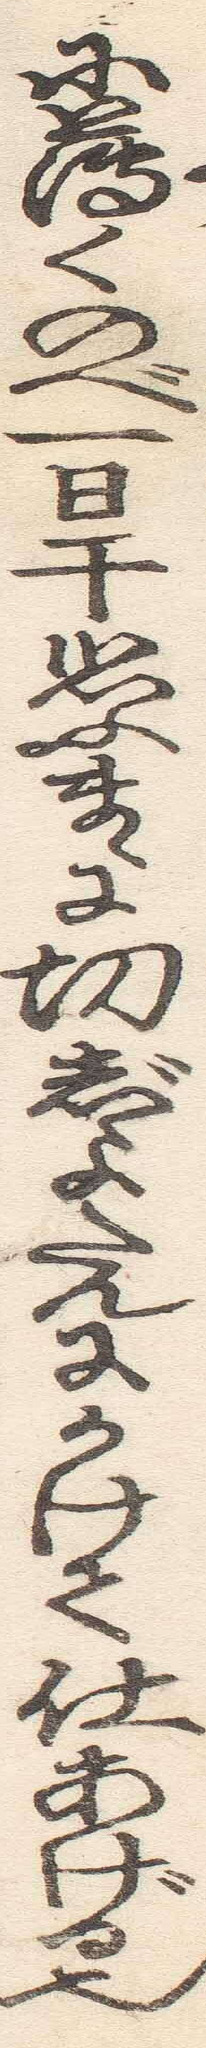に薄くのべ一日干思ふまゝに切じよたんにかけて仕あげる也
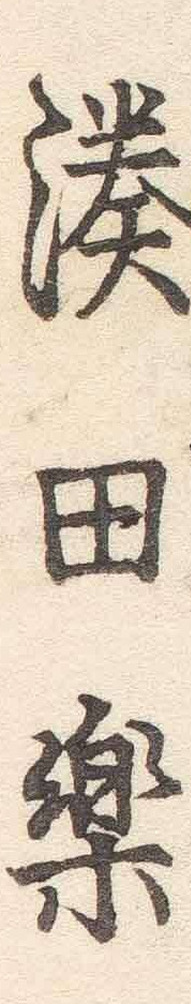湊田楽
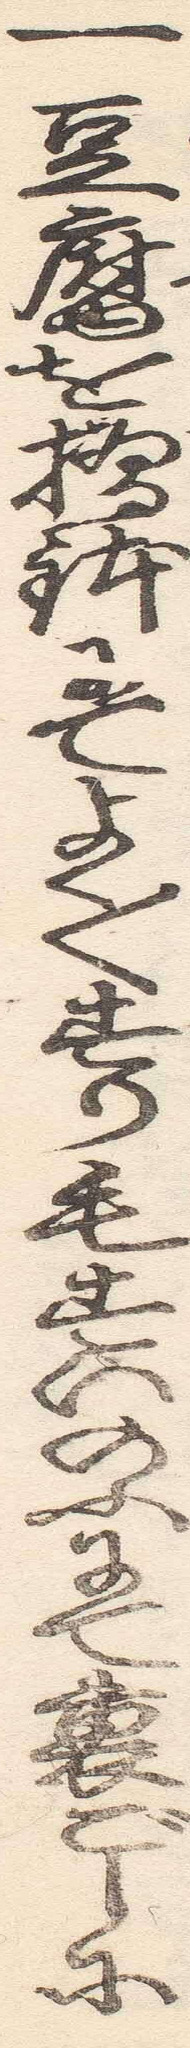一豆腐を摺鉢にてよく〳〵すり毛すいのふにて裏ごしに
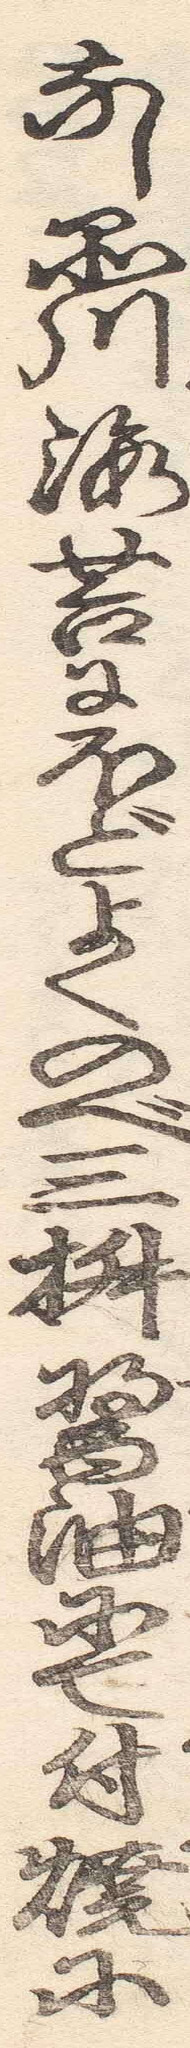なし品川海苔にほどよくのべ三桝醤油にて付焼に
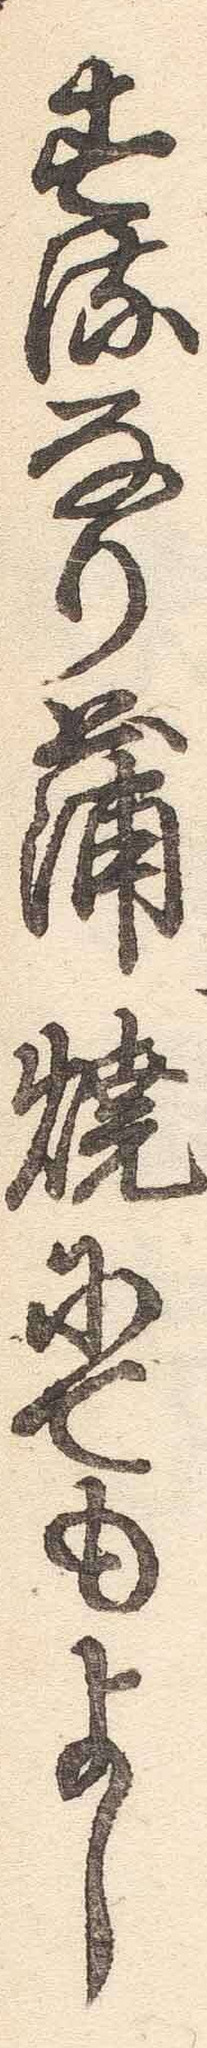するなり蒲焼にてもよし
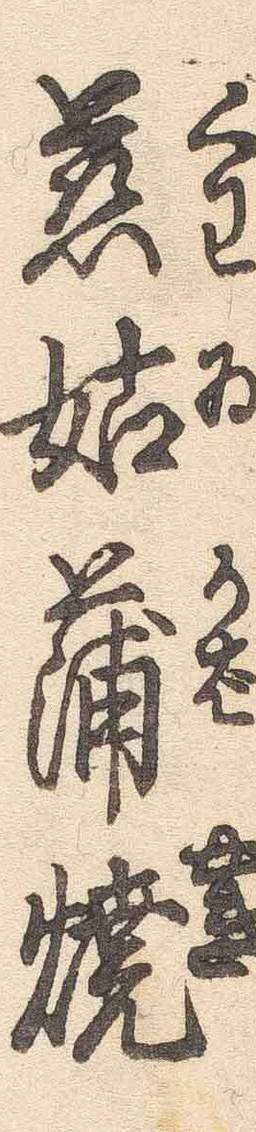慈姑蒲焼
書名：料理通
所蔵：東京学芸大学附属図書館 国文学研究資料館
